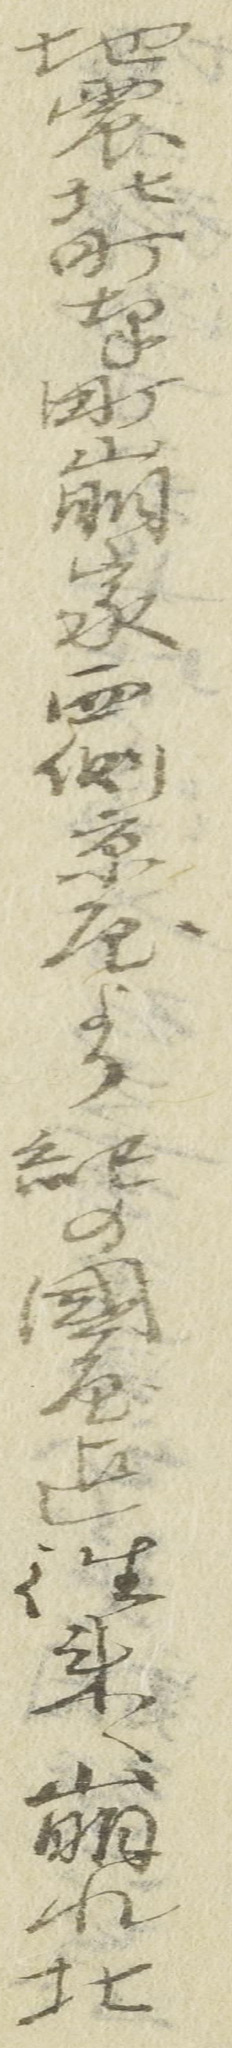地震北町南町崩家西側京屋より紀の国屋迄往来へ崩れ北
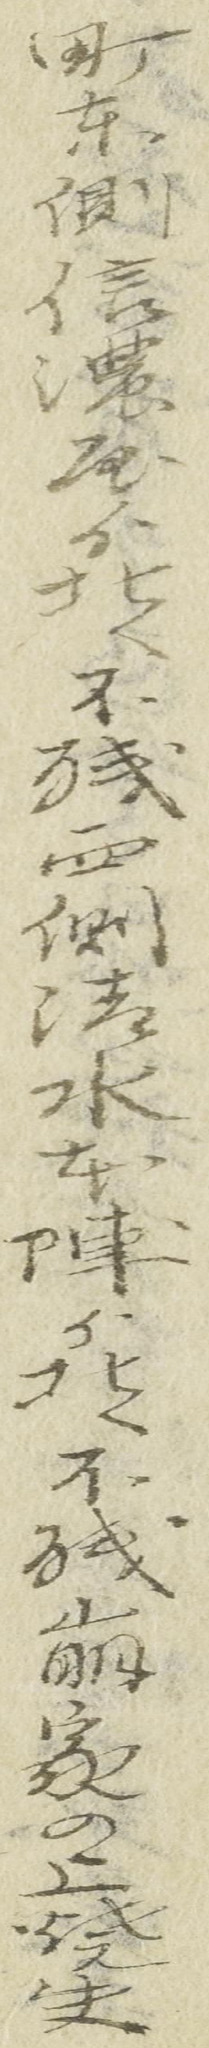町東側信濃屋から北へ不残西側清水本陣ゟ北へ不残崩家の上焼失
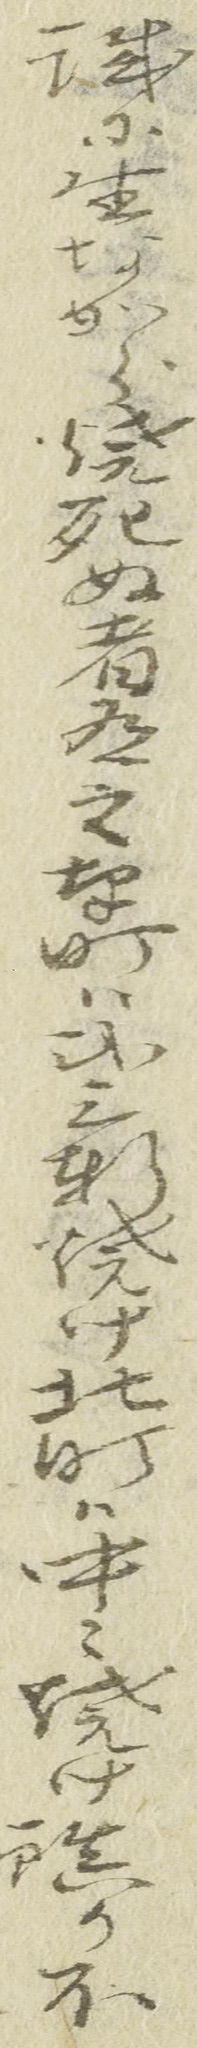誠に生なから焼死ぬ者有之南町は弐三軒焼け北町は中々焼け鎮り不
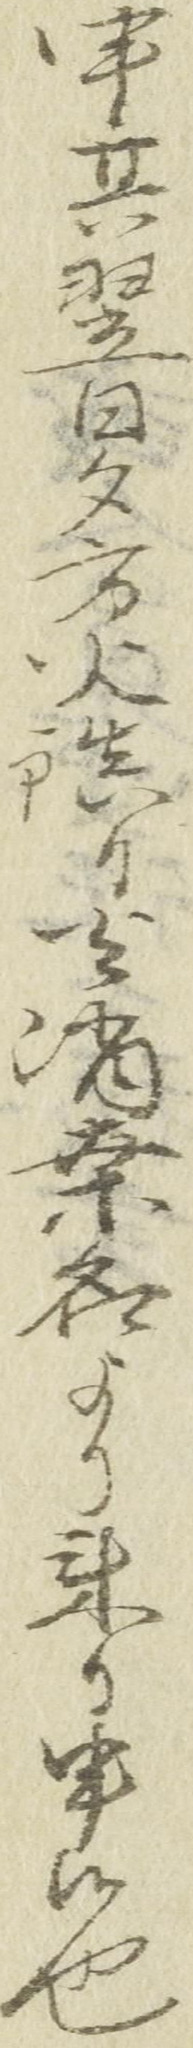申其翌日夕方火鎮り火消桑名より来り申候也
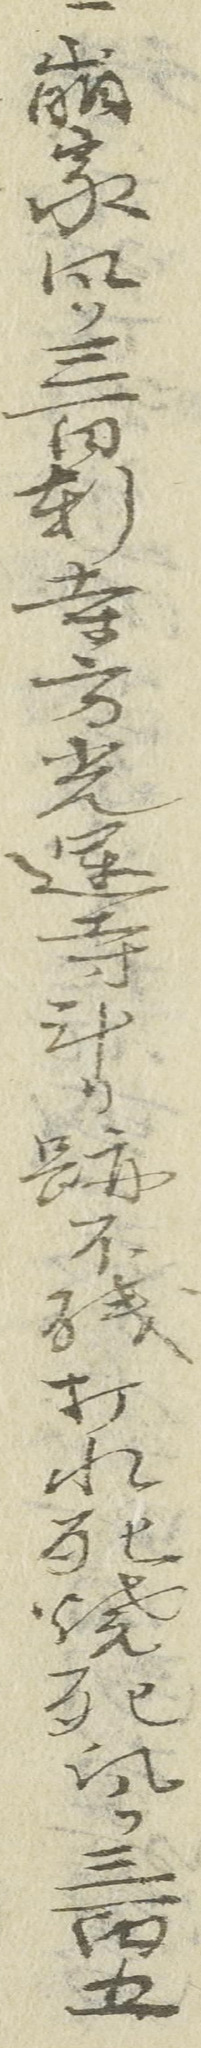一崩家凡そ三百軒寺方光運寺計り跡不残打れ死焼死凡そ三百五
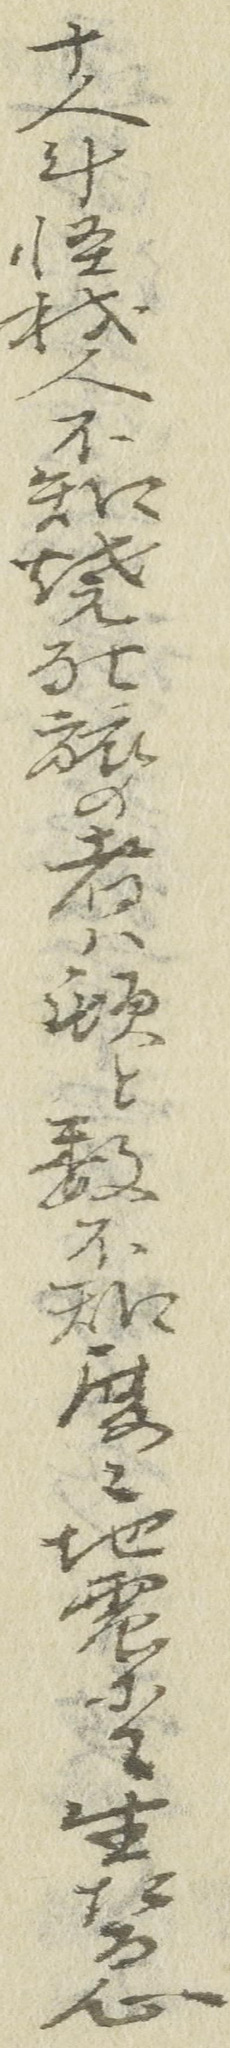十人計怪我人不知焼死旅の者は頓と数不知度々地震にて生たる心
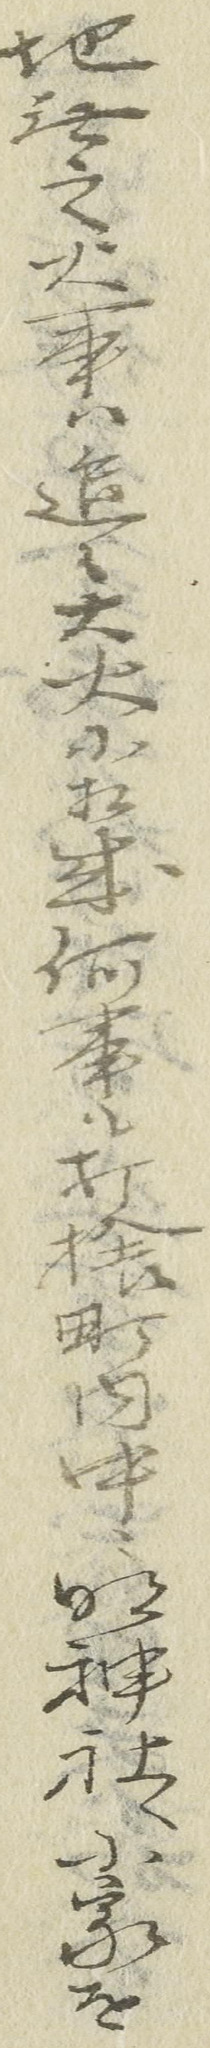地無く火事は追々大火に相成何事も打捨町内中々明神社へ小家を
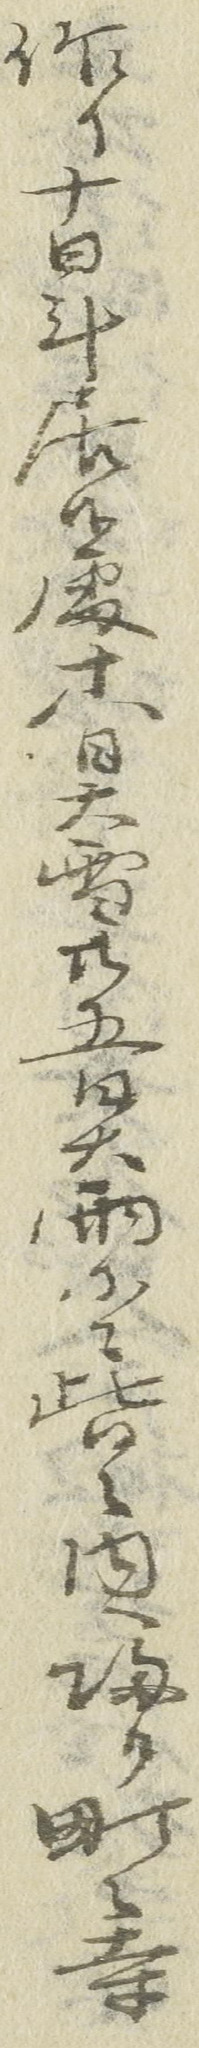作り十日計居候處十八日大雷廿五日大雨にて皆々内へ帰り町々寺
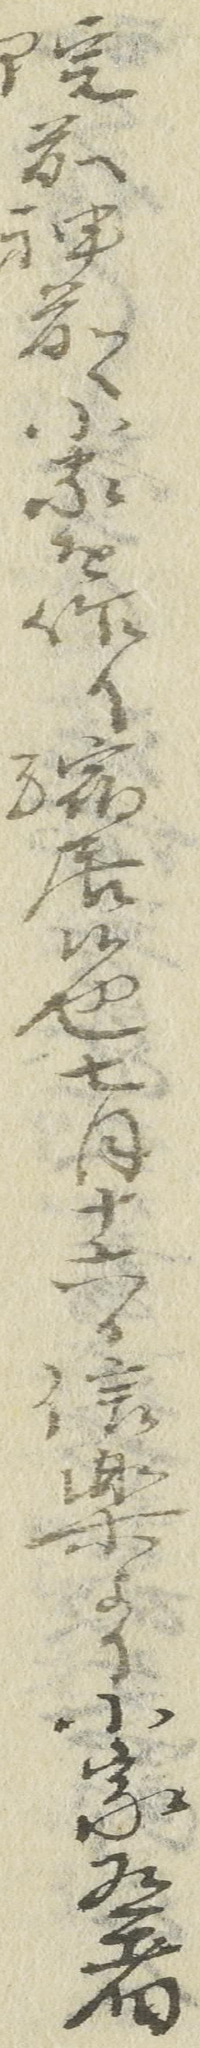院前神前へ小家を作り縮居候也七月十六日信楽より小家有者
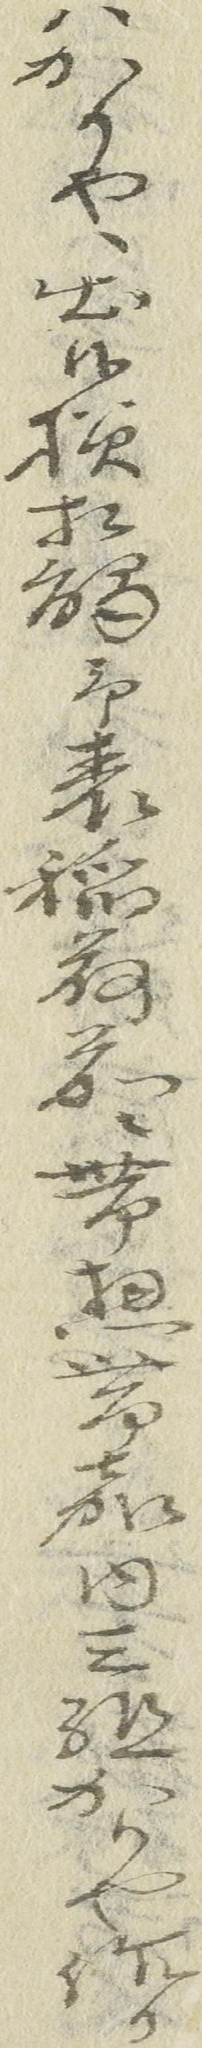はかりやゝ出候様相触市表稲荷前二帯惣帯嘉内三組かりや作り
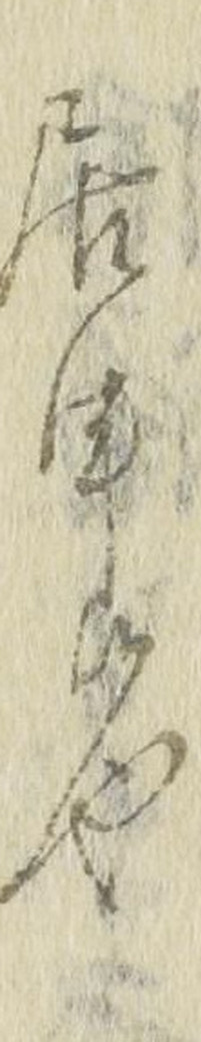居申候也
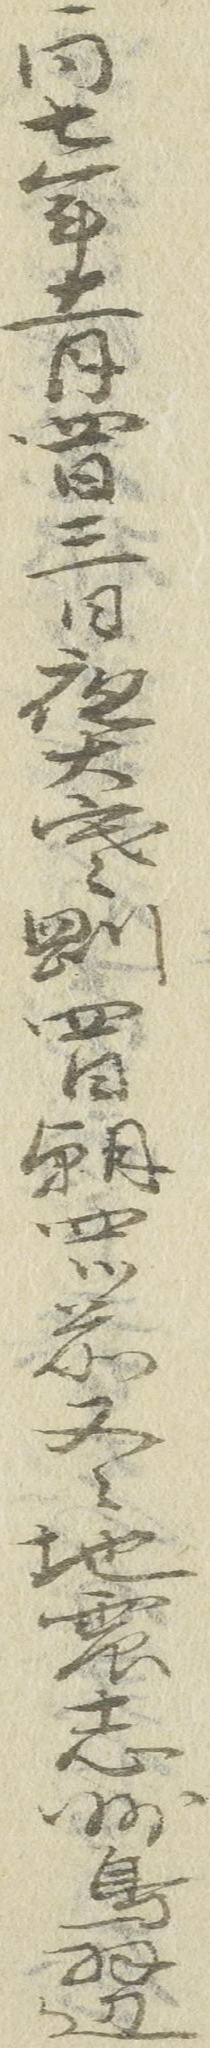一同七年十一月四日三日夜大寒剛四日朝四つ前又々地震志州鳥羽辺
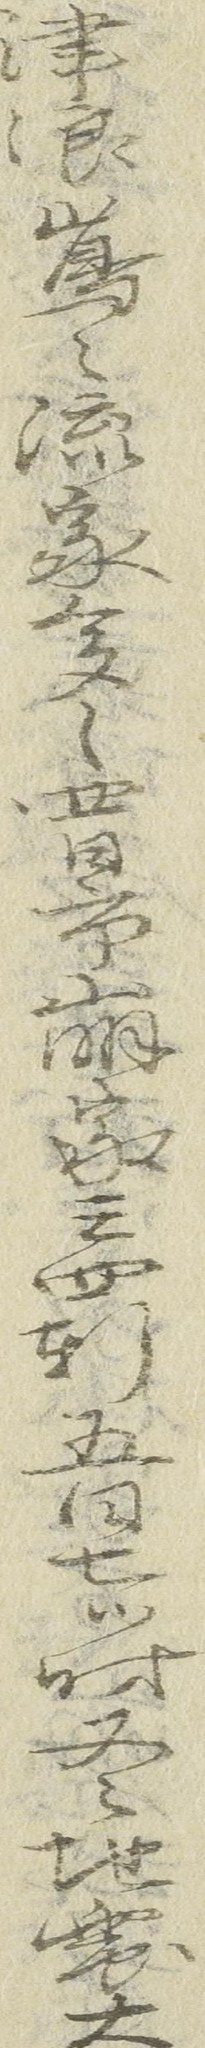津浪嶌々流家多し四日市崩家三四軒五日七つ時又々地震大
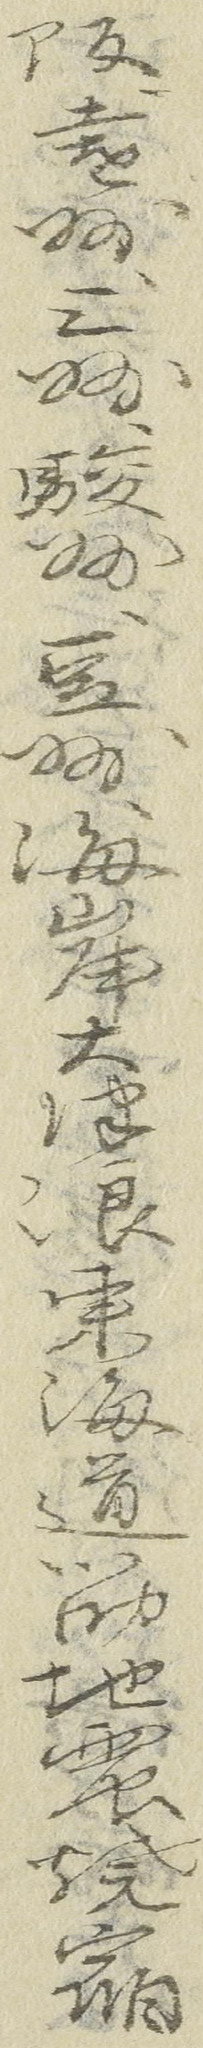阪、遠州、三州、駿州、豆州、海岸大津浪東海道筋地震焼崩
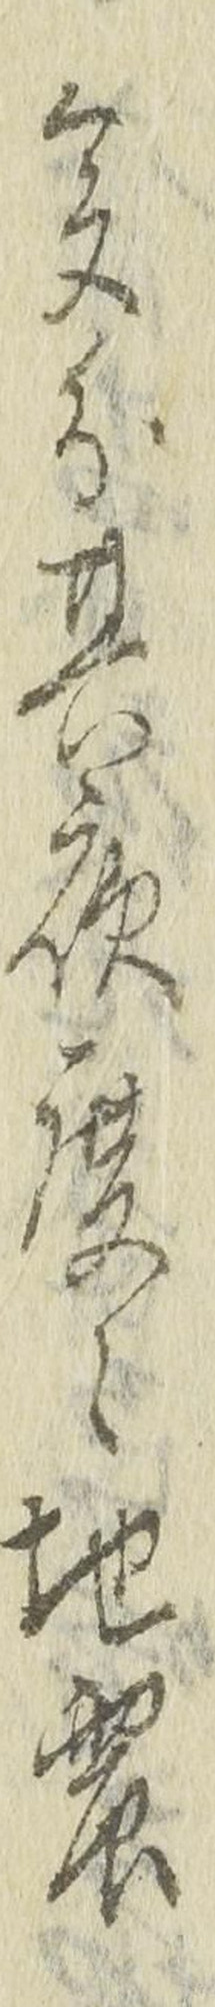多分其夜度々地震

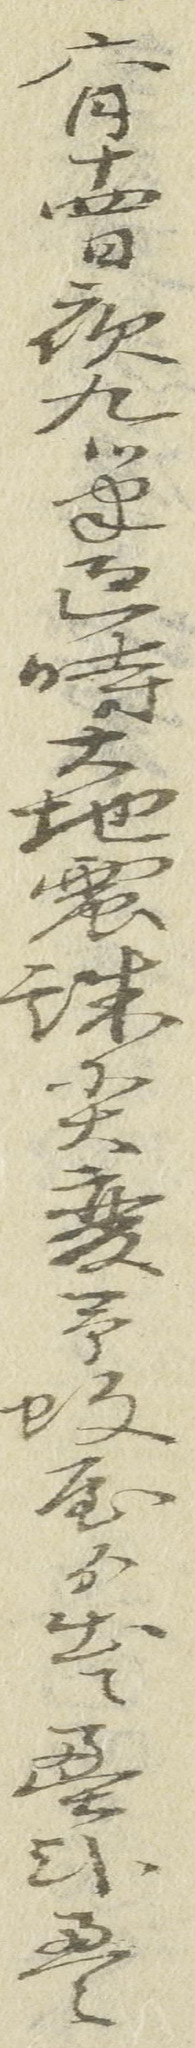一六月十四日夜九ツ半過時大地震誠に大変予改屋ゟ出て塁弐畳
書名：地震前兆集　全
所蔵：東京大学地震研究所図書室 Earthquake Research Institute Library, The University of Tokyo, JAPAN
